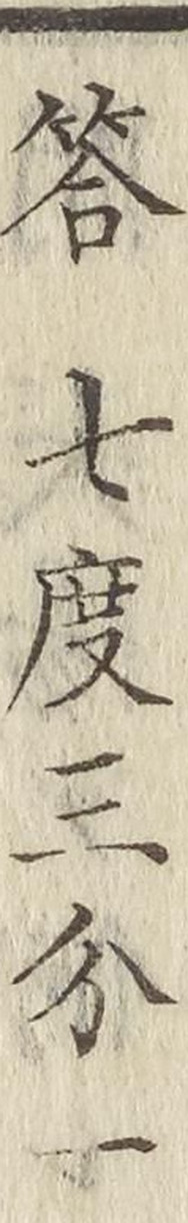答七度三分一
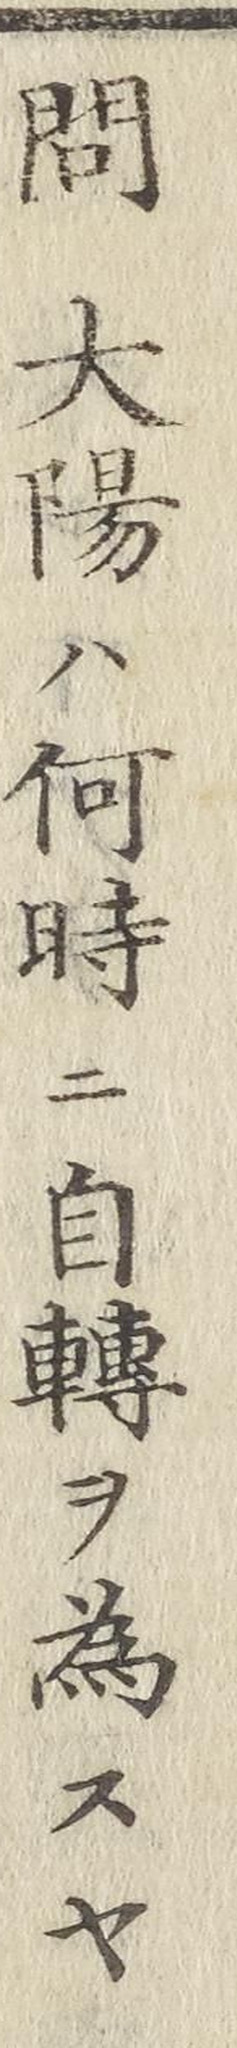問大陽ハ何時ニ自転ヲ成スヤ
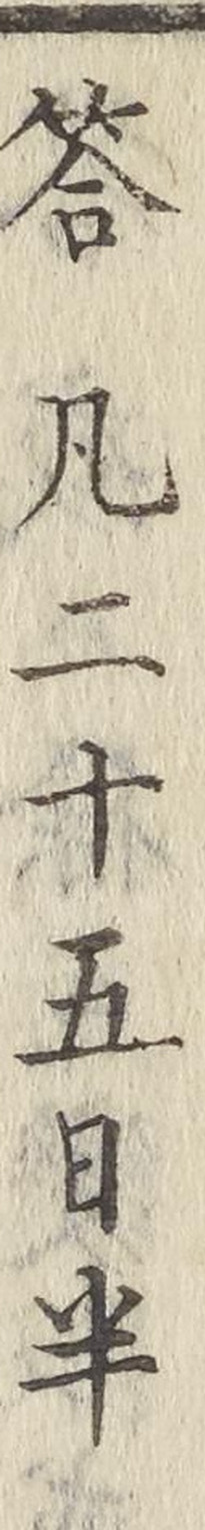答凡二十五日半
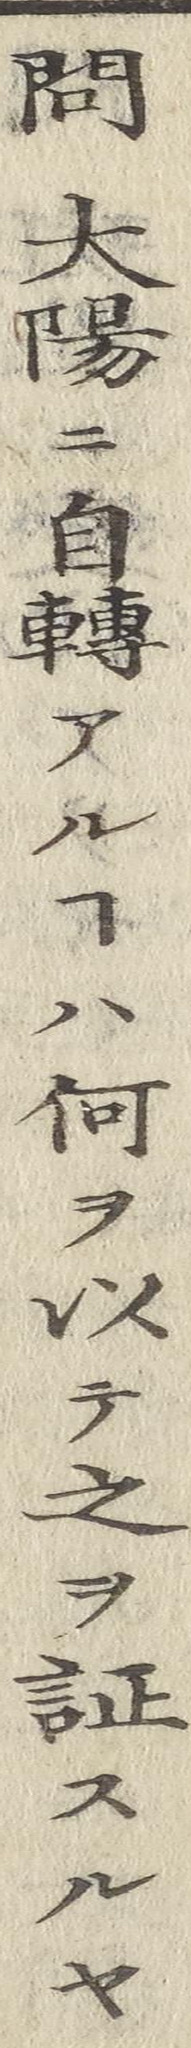問大陽ニ自転アルコトハ何ヲ以テ之ヲ証スルヤ
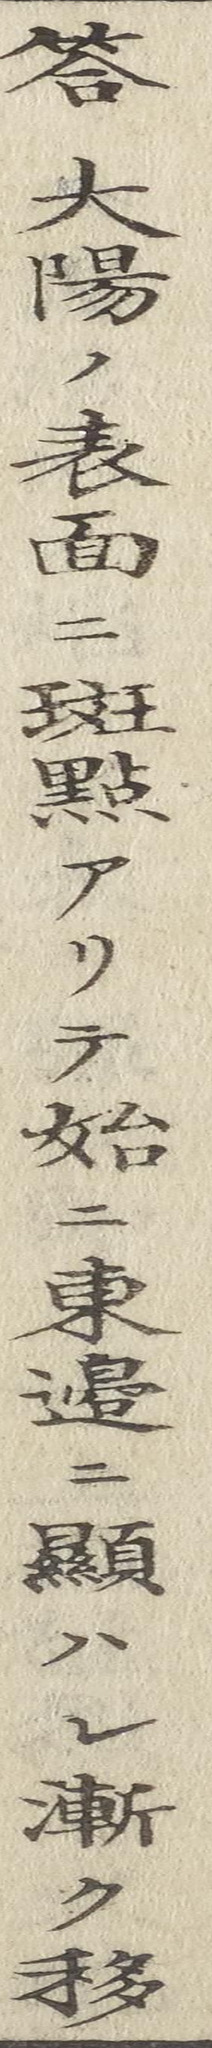答大陽ノ表面ニ斑点アリテ始ニ東辺ニ顕ハレ漸ク移
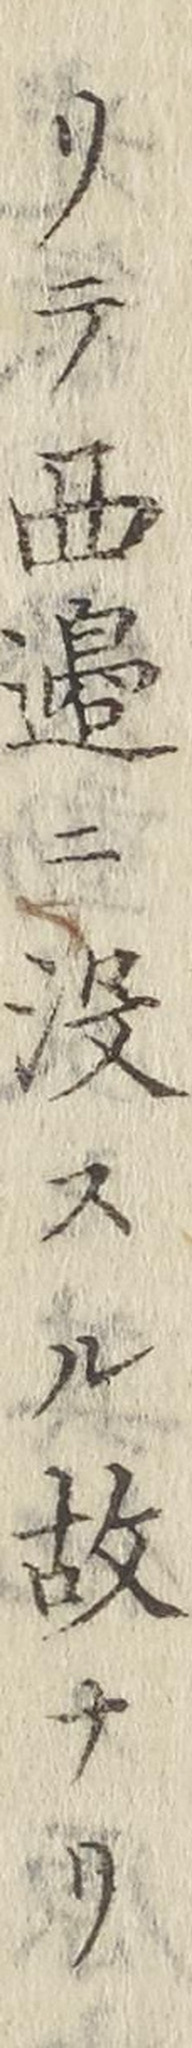リテ西辺ニ没スル故ナリ
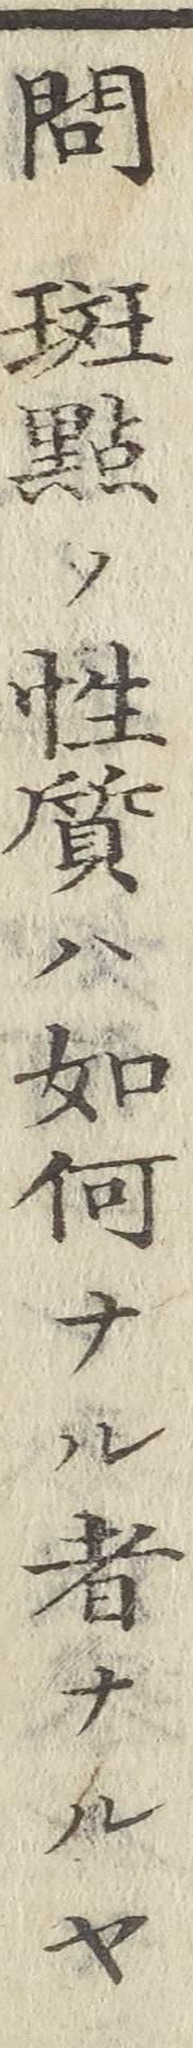問斑点ノ性質ハ如何ナル者ナルヤ
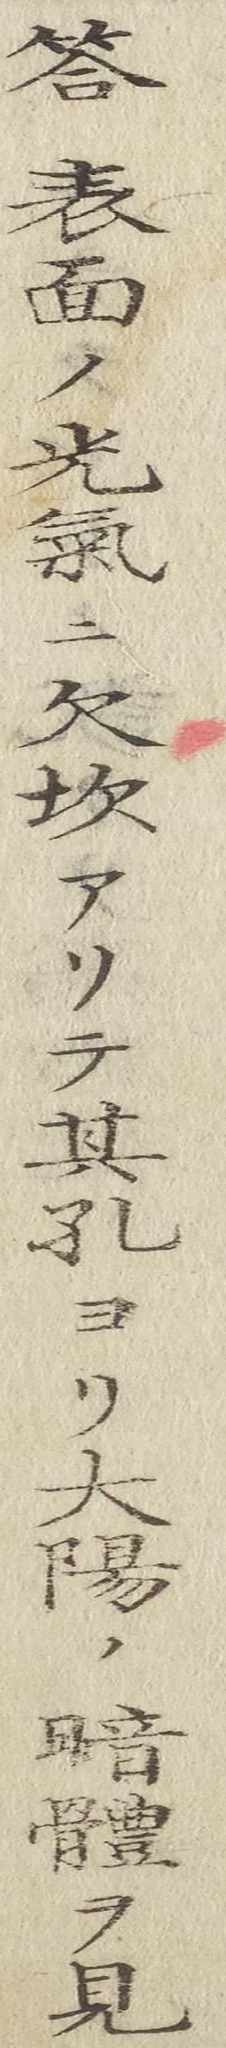答表面ノ光気ニ欠坎アリテ其孔ヨリ大陽ノ暗体ヲ見

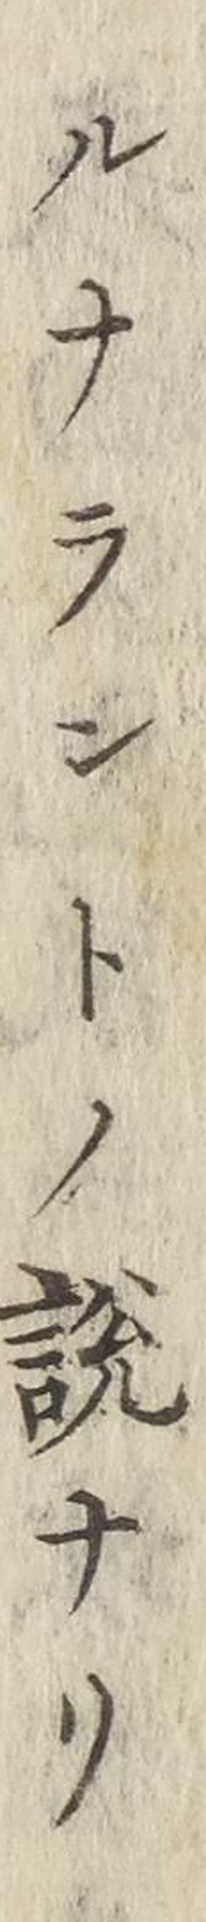ルナラントノ説ナリ
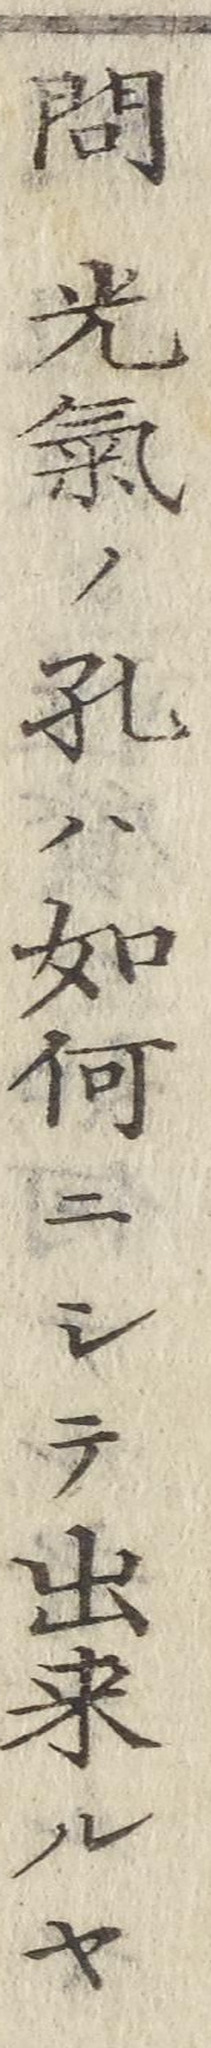問光気ノ孔ハ如何ニシテ出来ルヤ
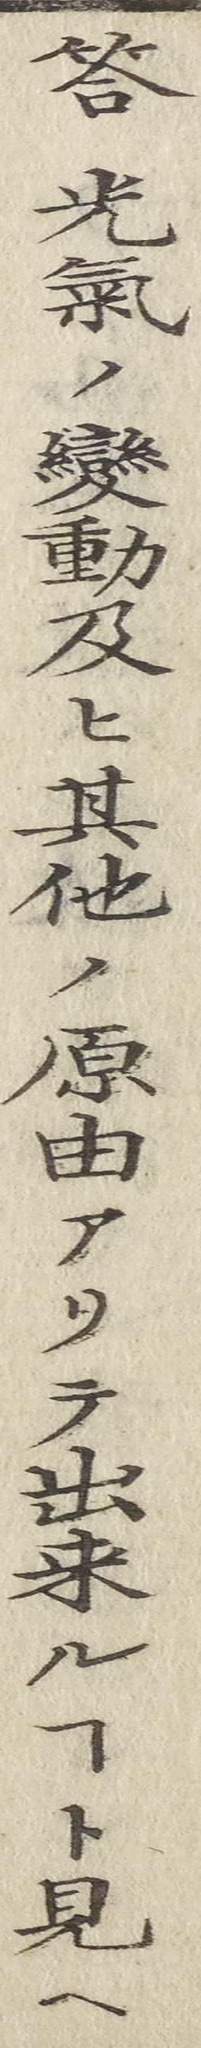答光気ノ変動及ヒ其他ノ原由アリテ出来ルコトト見ヘ
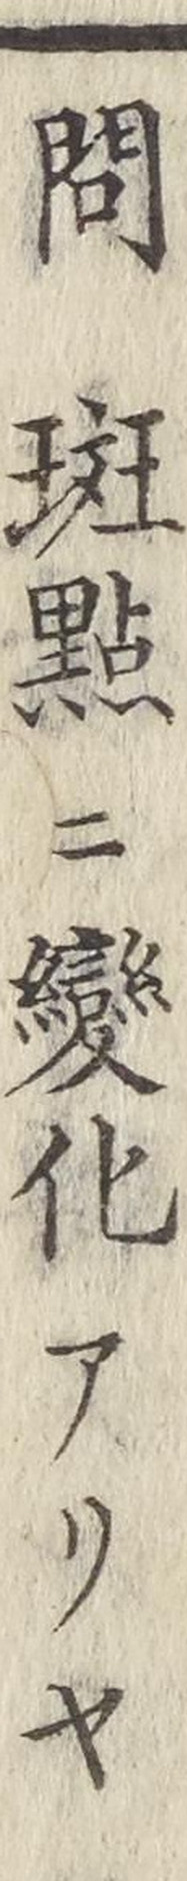問斑点ニ変化アリヤ
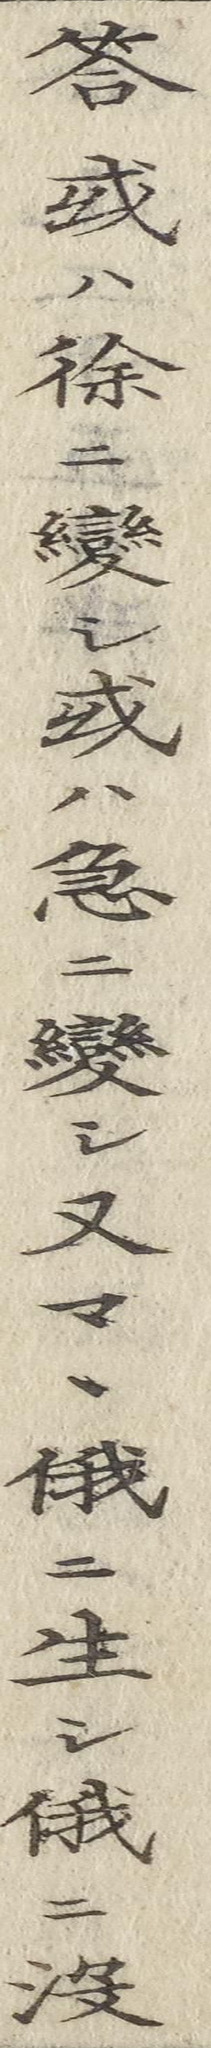答或ハ徐ニ変シ或ハ急ニ変シ又マヽ俄ニ生シ俄ニ没
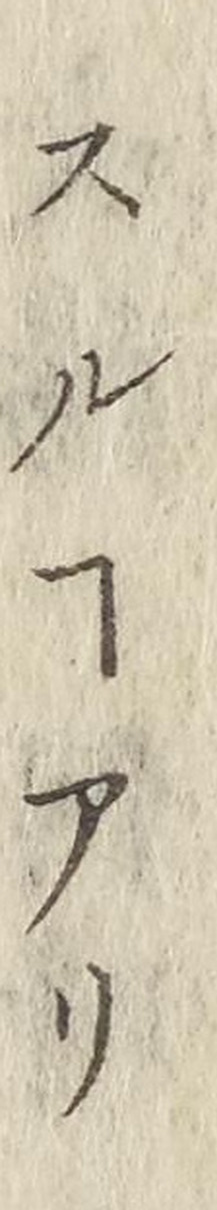スルコトアリ
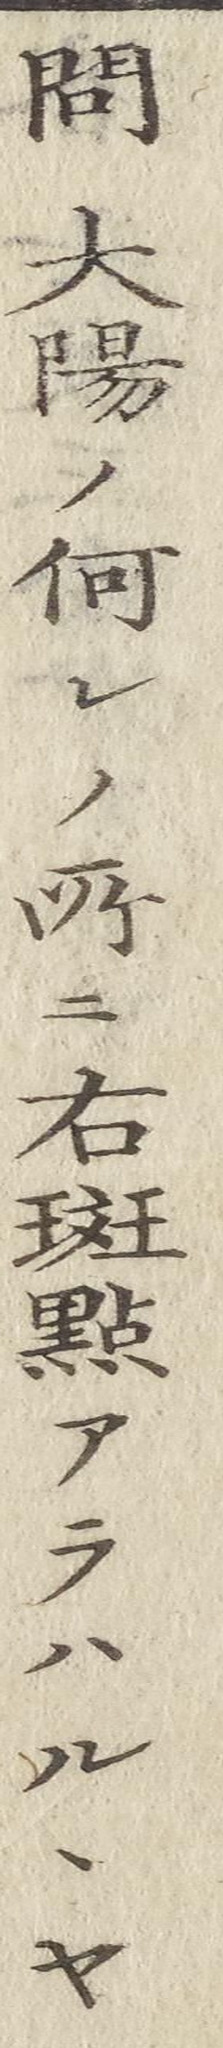問大陽ノ何レノ所ニ右斑点アラハルヽヤ
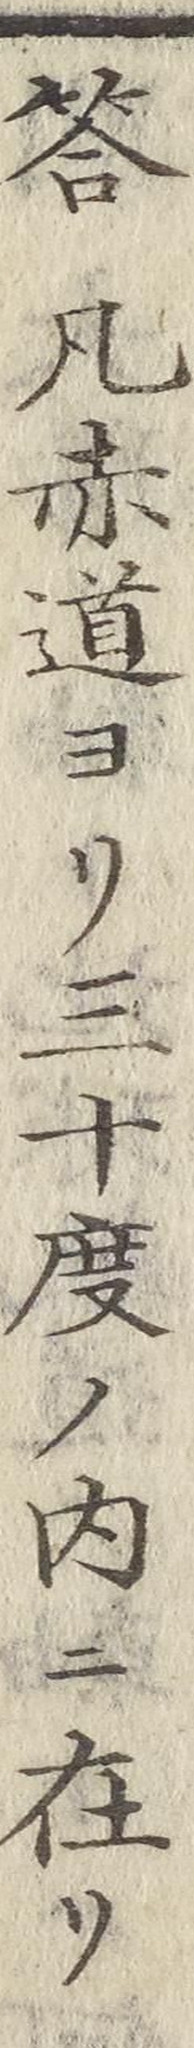答凡赤道ヨリ三十度ノ内ニ在リ
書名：星学圖説　上
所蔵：東京大学地震研究所図書室 Earthquake Research Institute Library, The University of Tokyo, JAPAN
